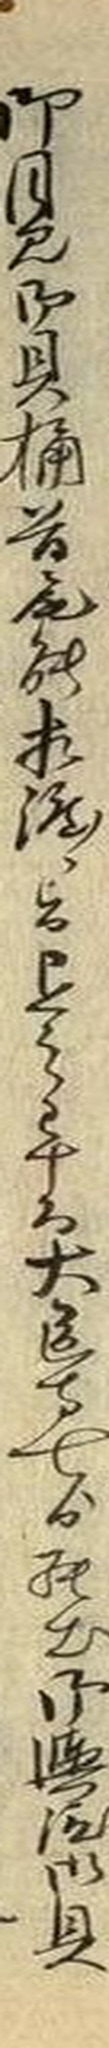御目見御貝桶首尾能相渡候旨申上之畢而大道寺七右衛門罷出御輿渡御貝
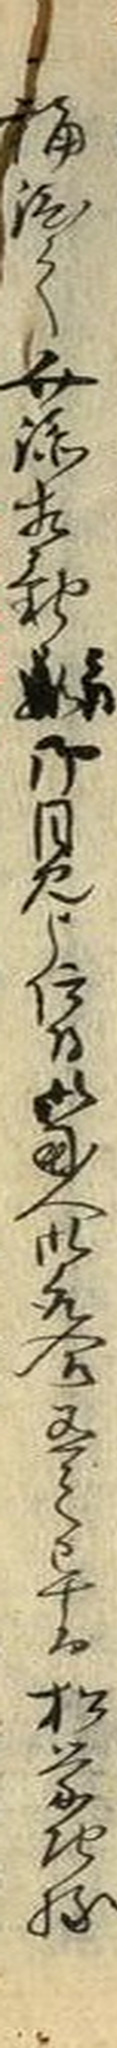桶渡之介添相勤候ニ付御目見被仰付御用人御取合有之畢而松栄院様
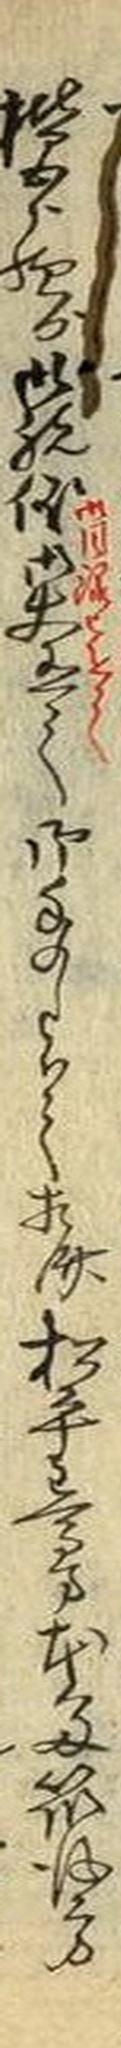楷五郎様ゟ御祝儀御使有之御手のし被下之相済松平主馬方本多筑後方
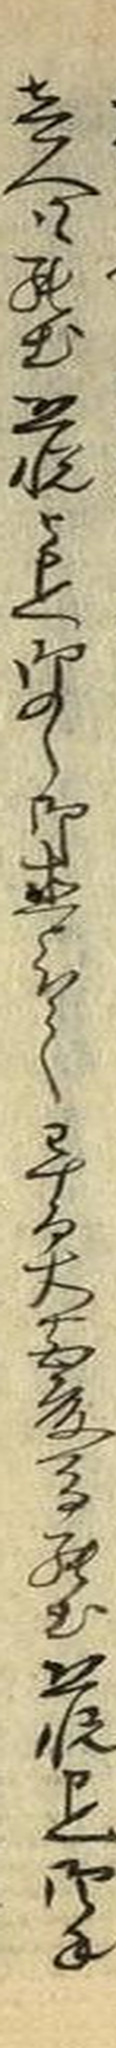壱人ツヽ罷出恐悦被申上御のし御直被下之畢而大宮藤馬罷出恐悦申上御手
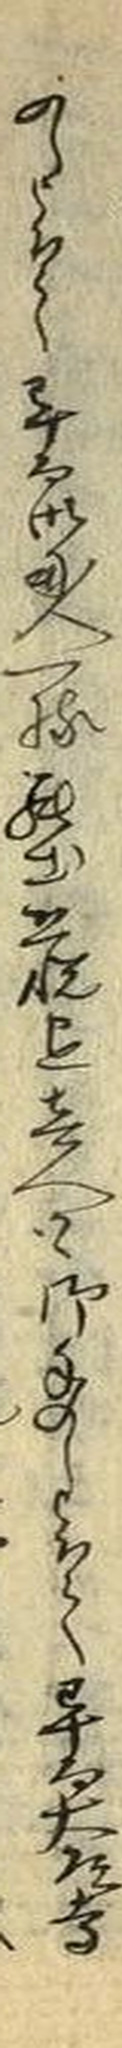のし被下之畢而御用人一統罷出恐悦申上壱人ツヽ御のし被下之畢而大道寺
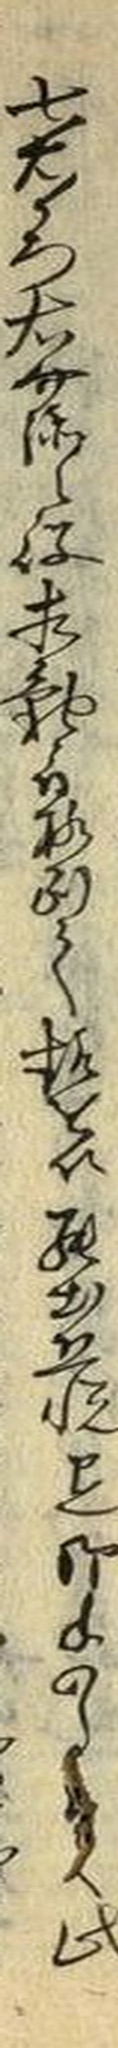七右衛門右介添之役相勤候ニ付格別之趣を以罷出恐悦申上御手のし被下之此
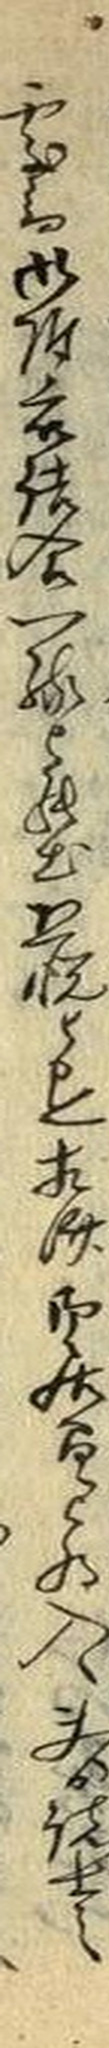処ニ而御附衆詰合一統被罷出恐悦被申上相済御居間へ被為入候夫ゟ諸士之
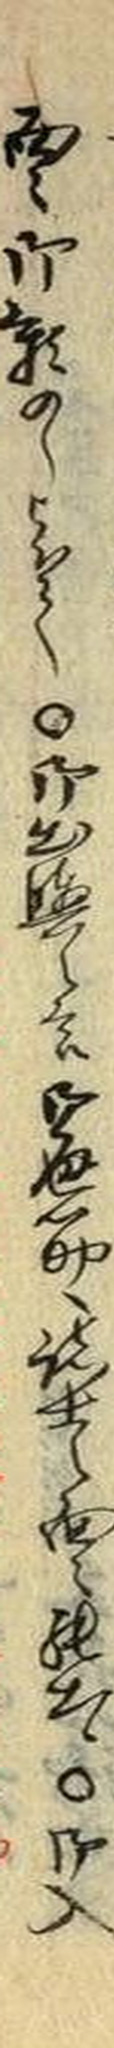面々御影のし被下之〇御出輿之節御通筋へ諸士之面々罷出候〇御入
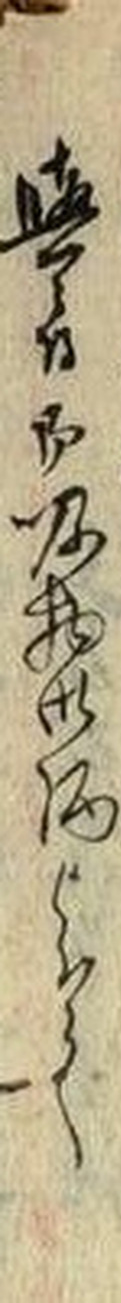輿ニ付御吸物御酒被下之
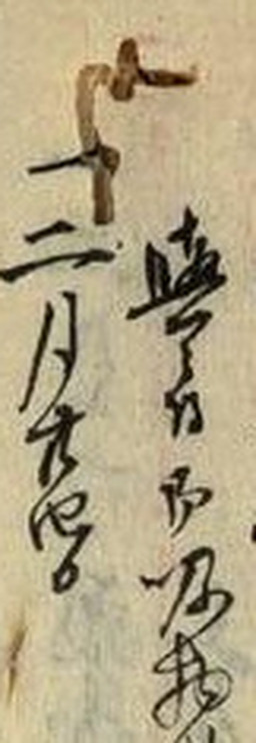一二月廿四日
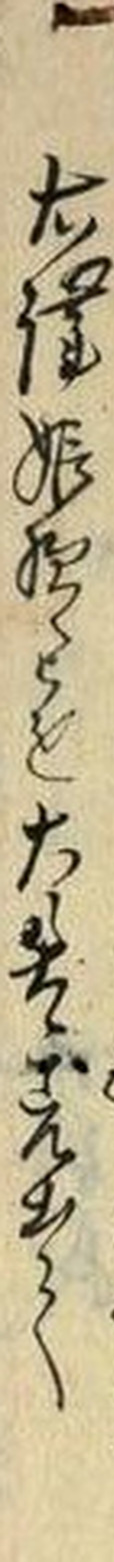右謹姫様へ被進大奥へ差出之
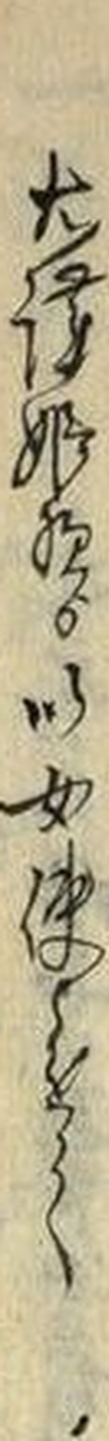右謹姫様ゟ以女使被進之
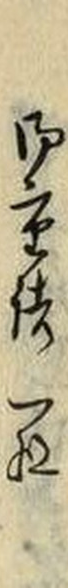御重詰一組
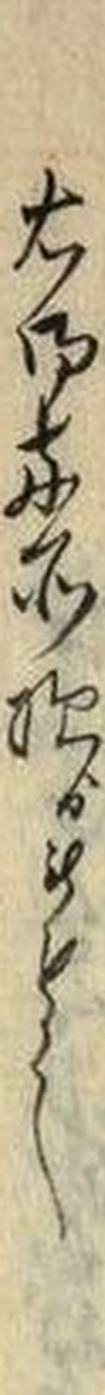右御両所様ゟ被進之
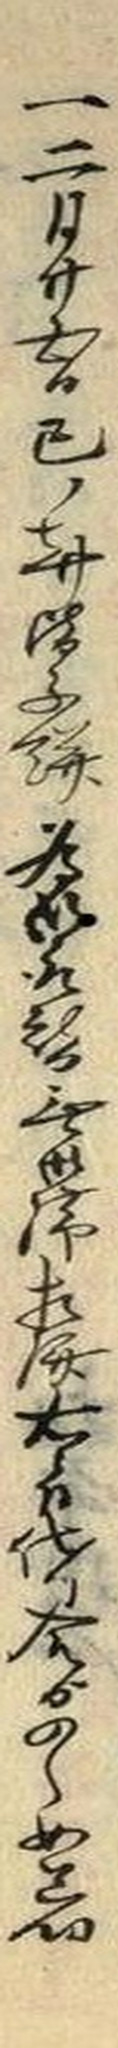一二月廿五日巳ノ刻皆子餅為御取替無御滞相済右ニ付代り合ゟのしめ着
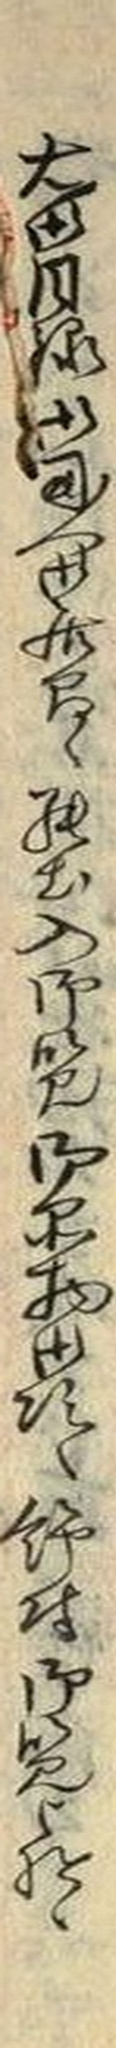右御目録御用人御居間へ罷出入御覧御品物御次へ飾付御覧被遊候
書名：少傅日録抄（斉善付側向頭取日記、江戸并道中、初入在国、逝去後…
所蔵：福井県文書館 Fukui Prefectural Archives
